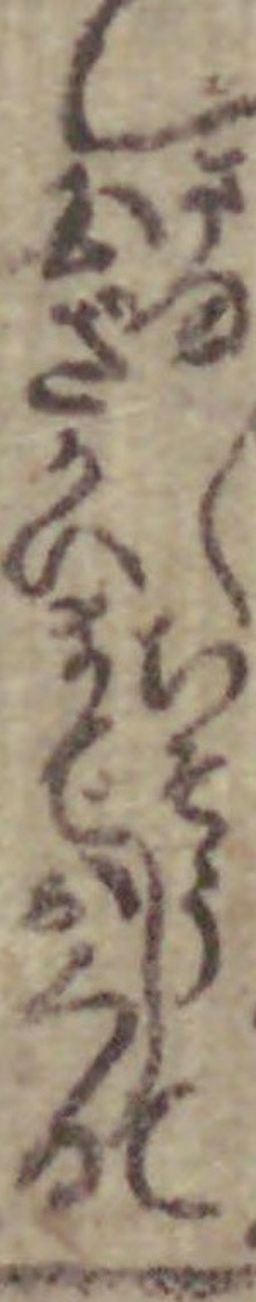国ざかいまでおくる
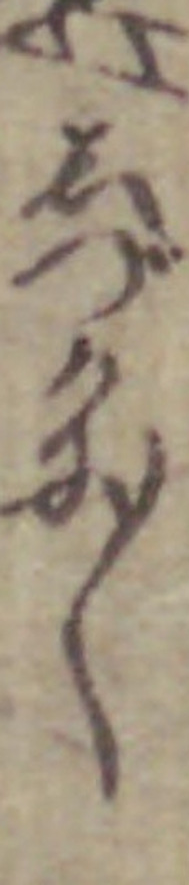しづかに〳〵
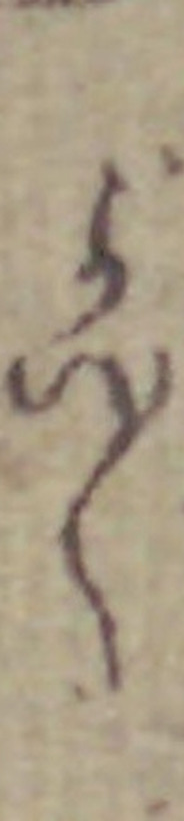よい〳〵

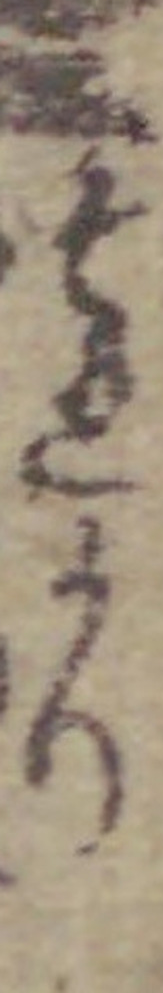それより
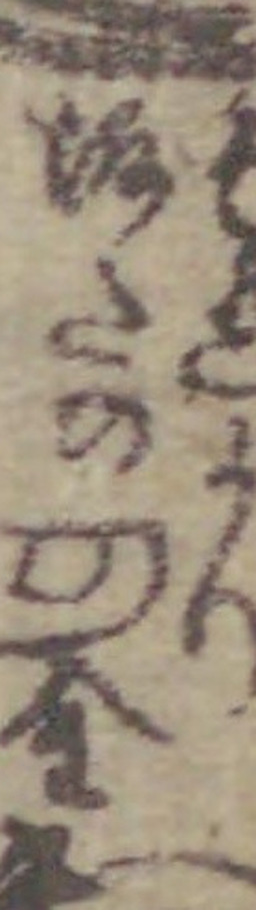坂たの金平
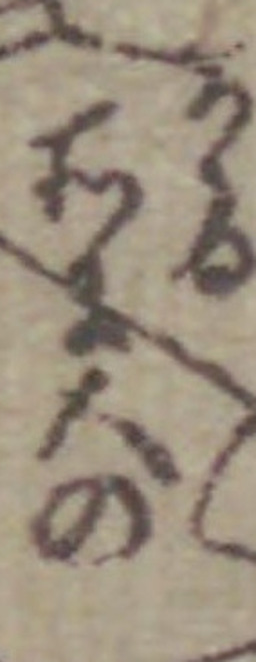所に人の
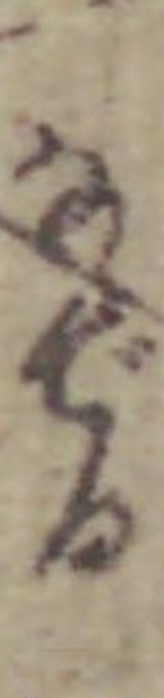なでる
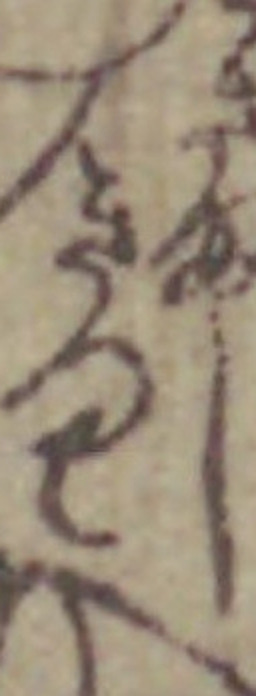きつね

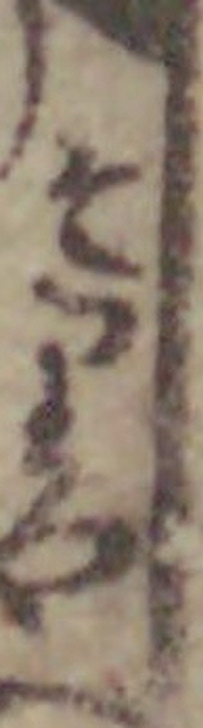そりや

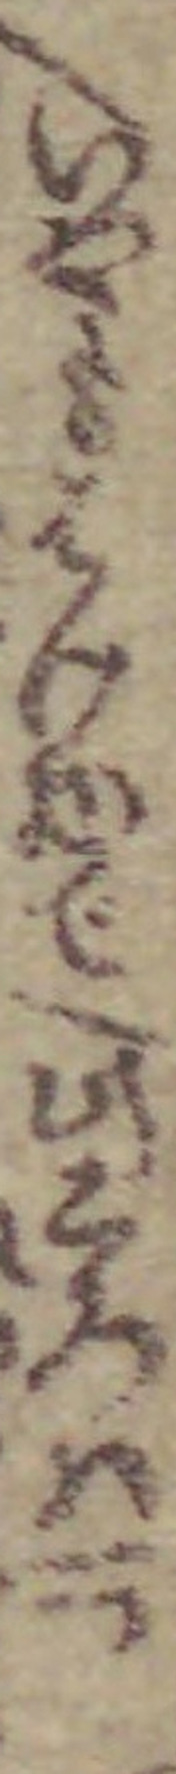いやもはけ物で此ごろは一つ
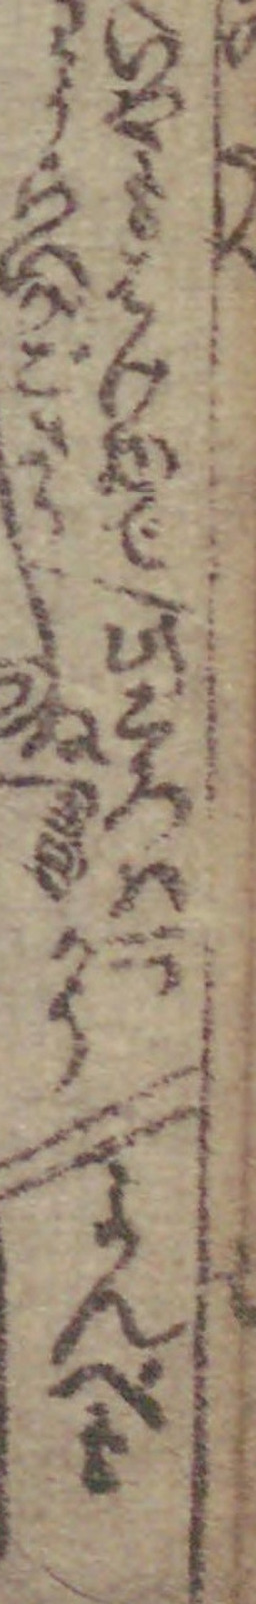いやもはけ物で此ごろは一つ
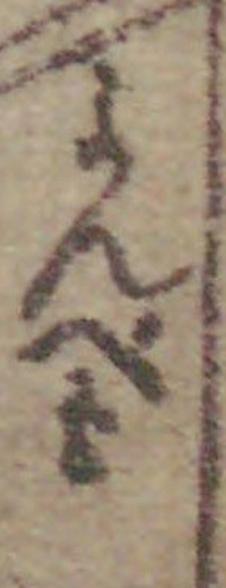よんべも
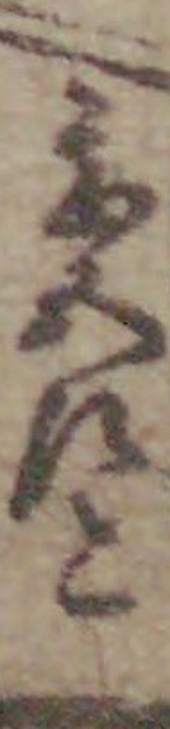甚五郎と
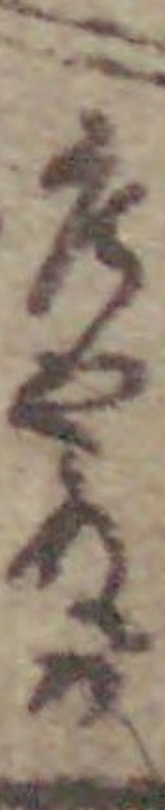庄や殿が
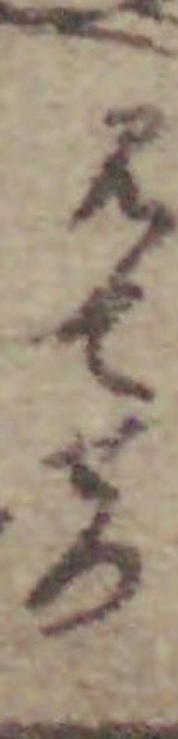見てせつ
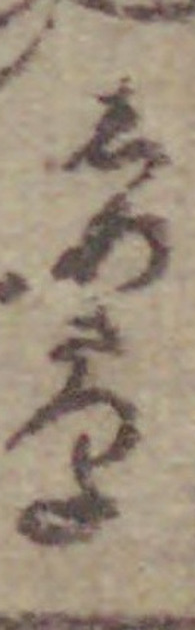しめさつた
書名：妖怪雪濃段 2巻
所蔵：国立国会図書館 National Diet Library, JAPAN
